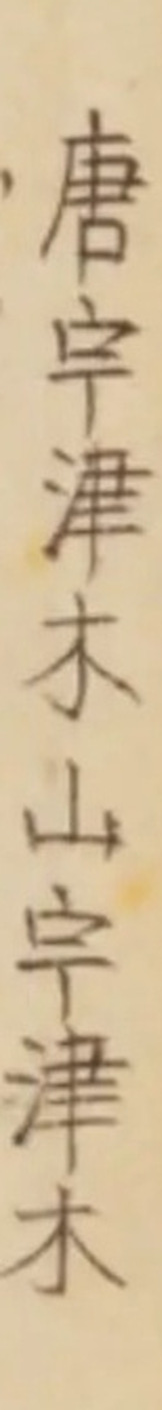空宇津木山宇津木
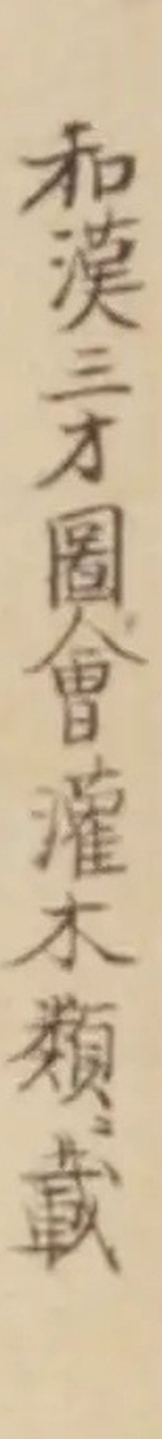和漢三才圖會灌木類ニ載
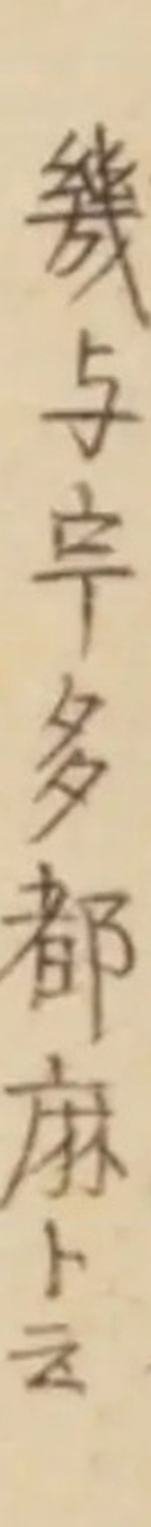幾与宇田都麻ト云
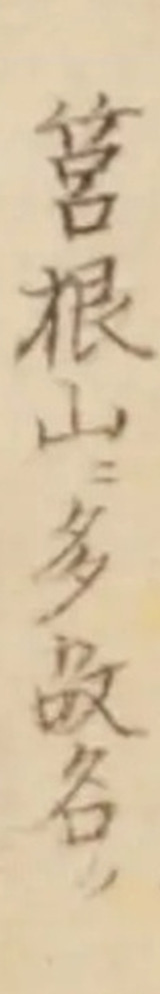筥根山ニ多品名ク
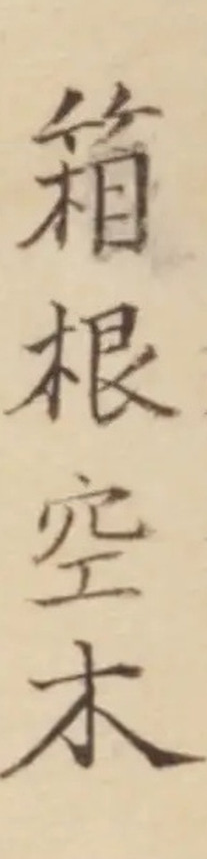箱根空木
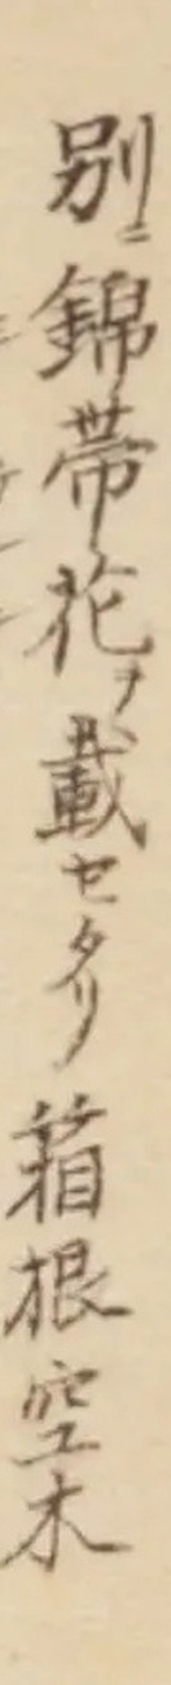別ニ錦帯花ヲ載セタリ箱根空木
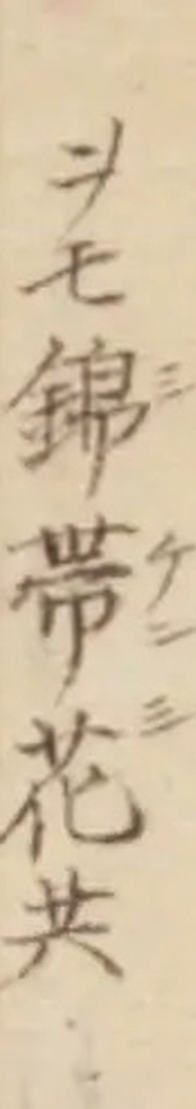ヲモ錦帯花共
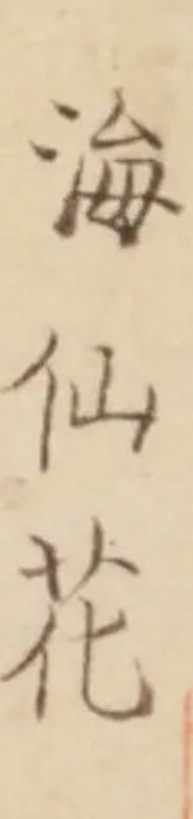海仙花
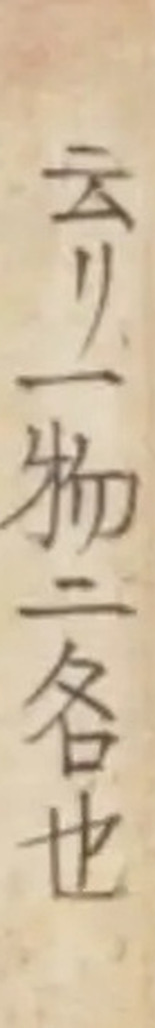云リ一物二名也
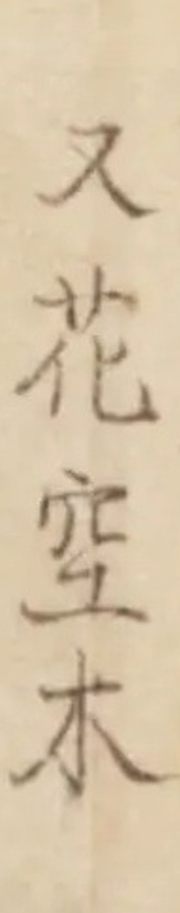又花空木
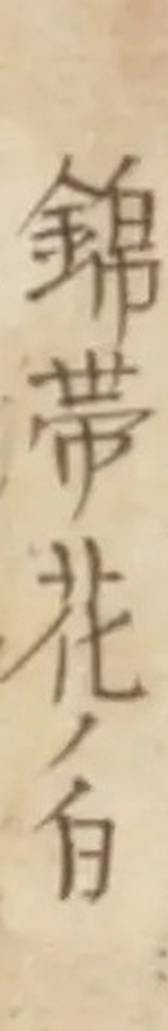錦帯花ノ白
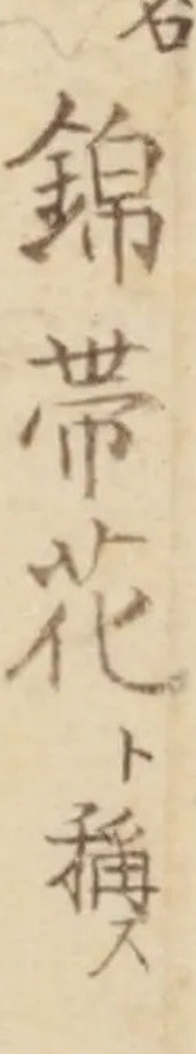錦帯花ト称ス
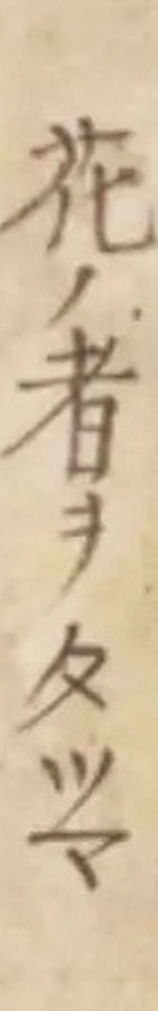花ノ者をタツマ
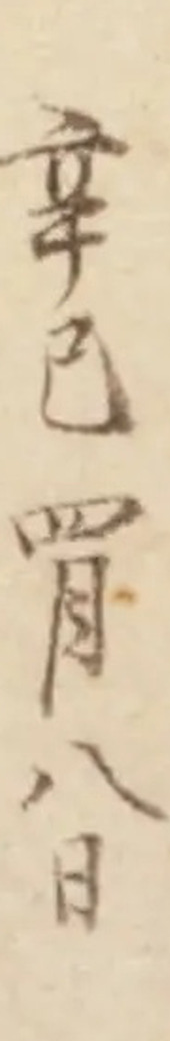辛巳四月八日
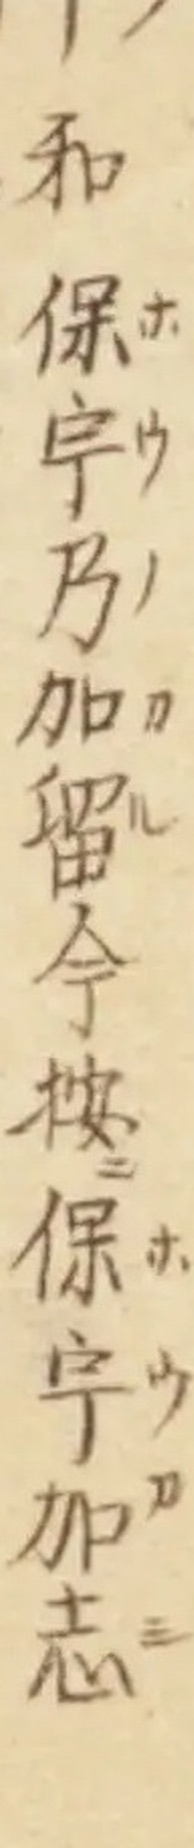厚朴和保宇乃加留今按ニ保宇加志
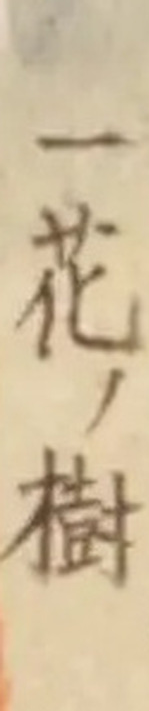一花ノ樹
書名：梅園草木花譜夏之部. 1
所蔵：国立国会図書館 National Diet Library, JAPAN
